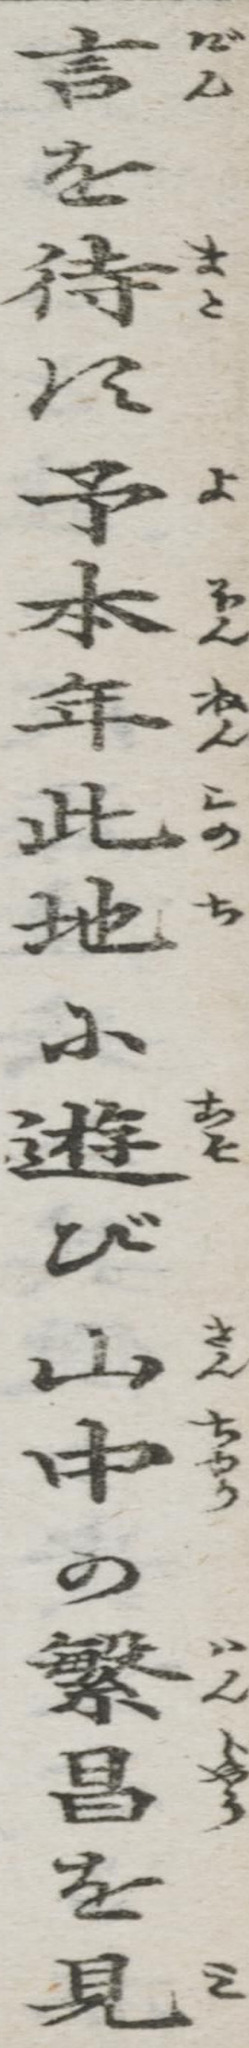言を待す予本年此地に遊び山中の繁昌を見
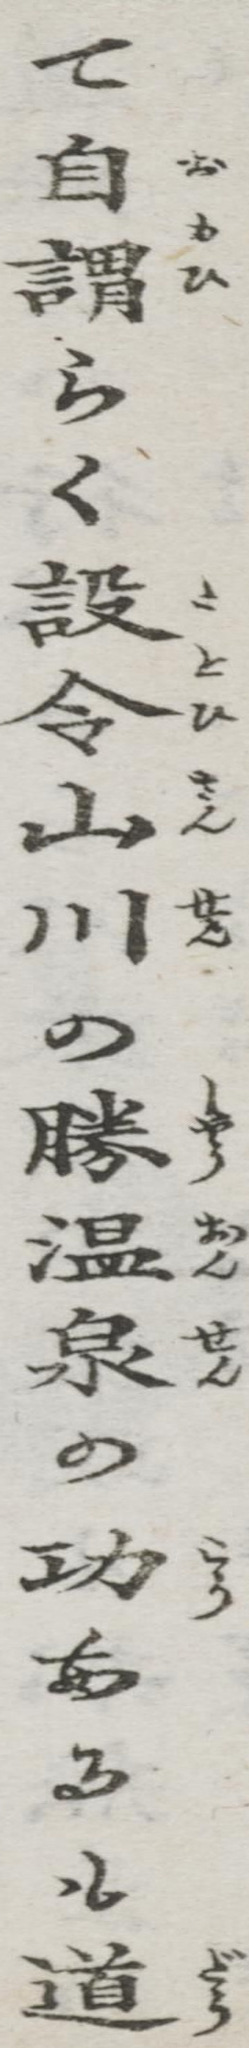て自謂らく設令山川の勝温泉の功あるも道
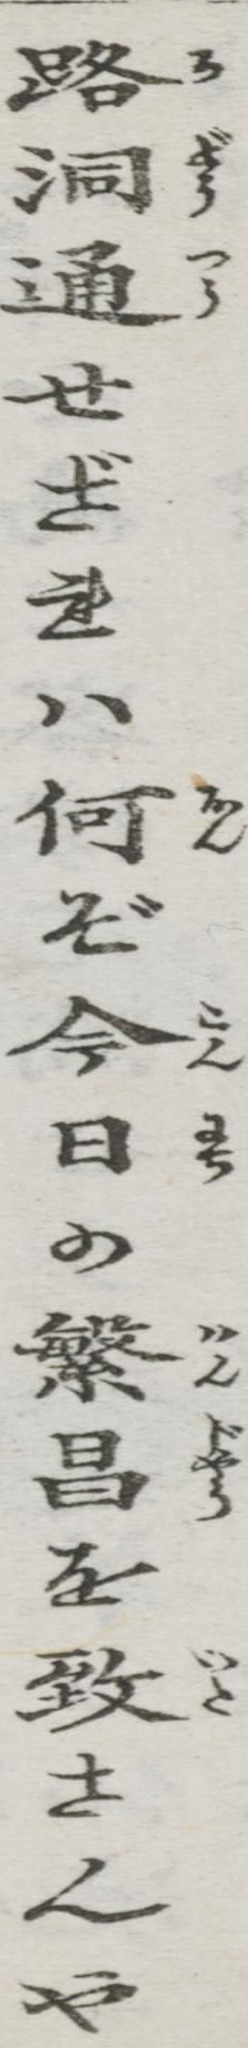路洞通せざれは何ぞ今日の繁昌を致さんや
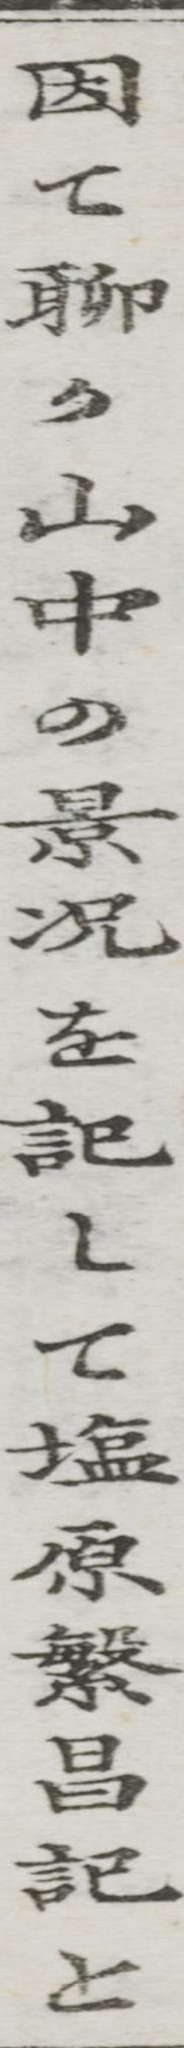因て聊か山中の景況を記して塩原繁昌記と
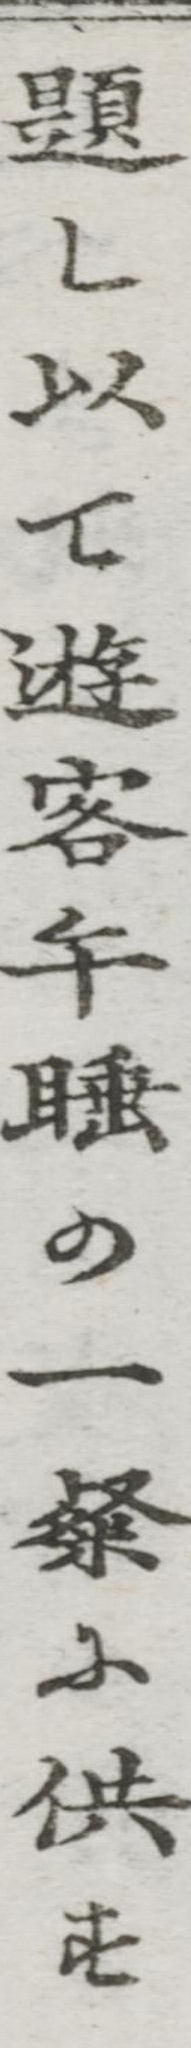題し以て遊客午睡の一粲に供す
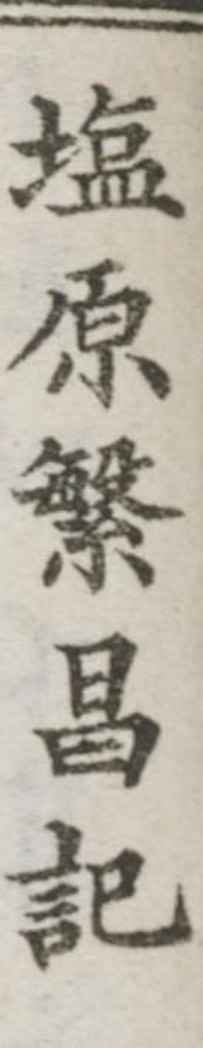塩原繁昌記
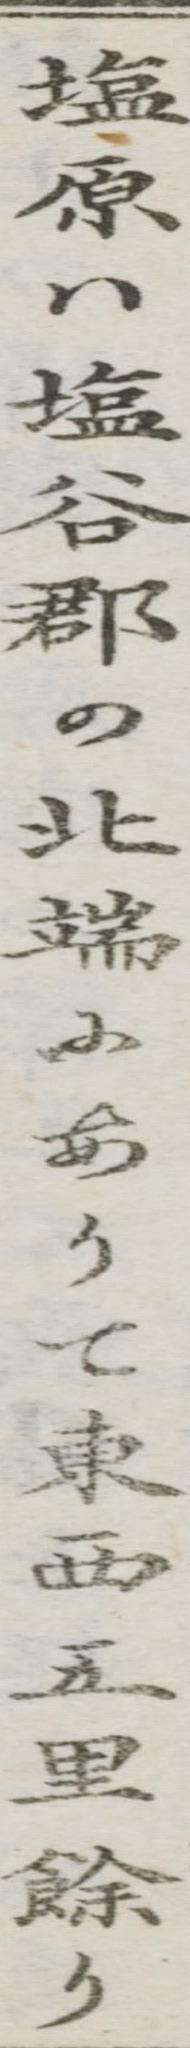塩原は塩谷郡の北端にありて東西五里許り
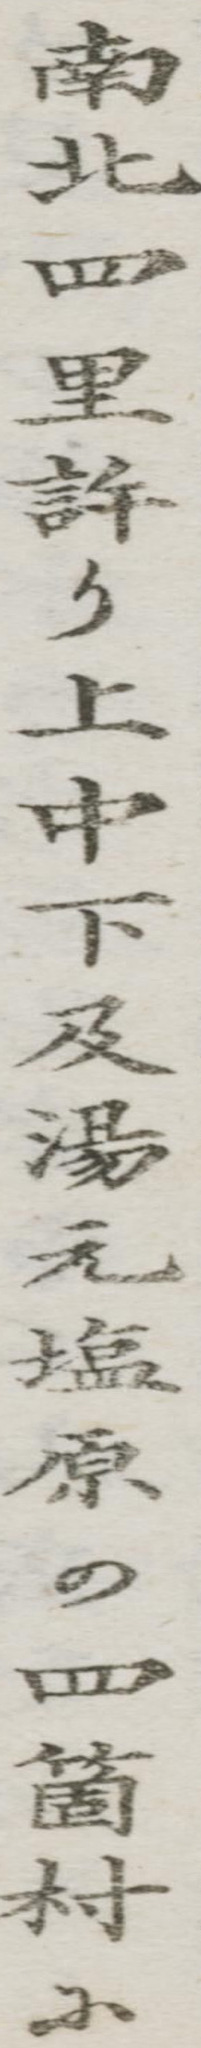南北四里許り上中下及湯元塩原の四箇村に
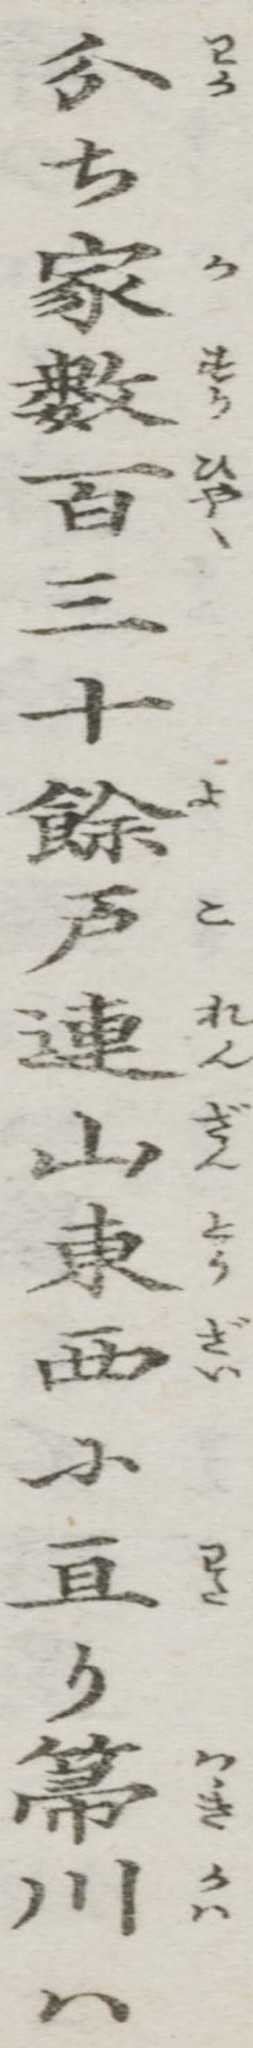分ち家数百三十余戸連山東西に亘り箒川は
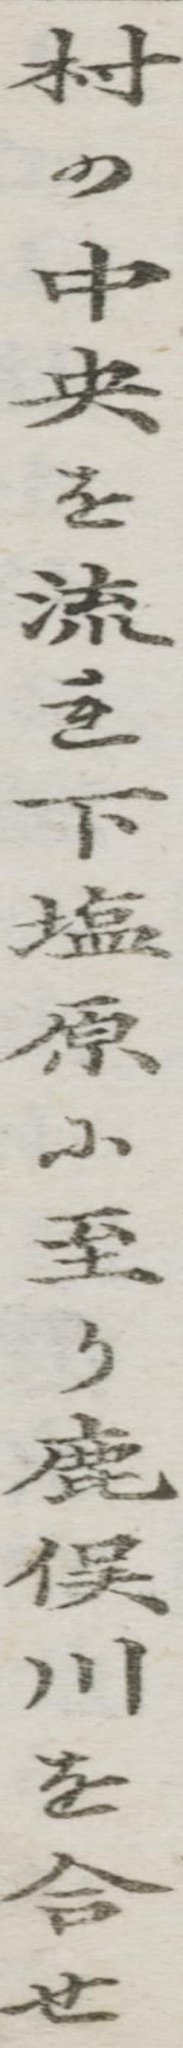村の中央を流れ下塩原に至り鹿俣川を合せ
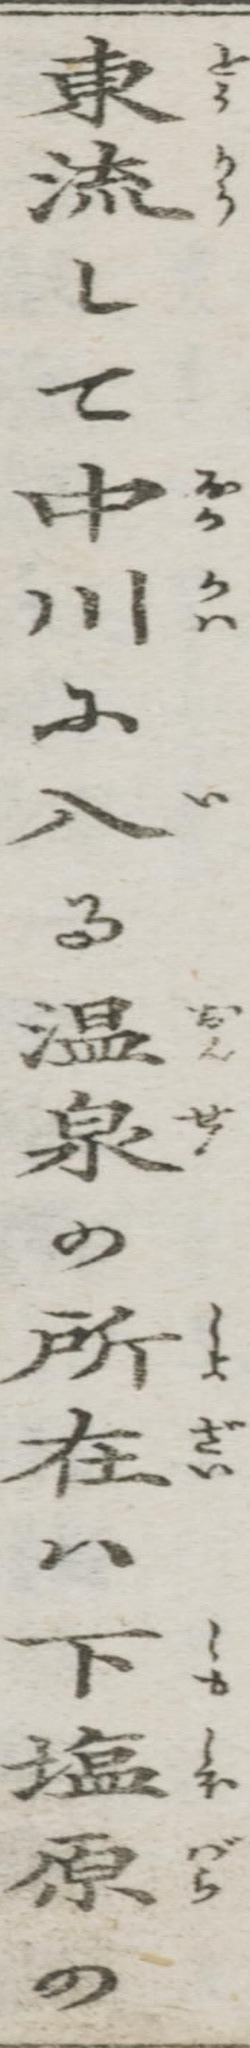東流して中川に入る温泉の所在は下塩原の
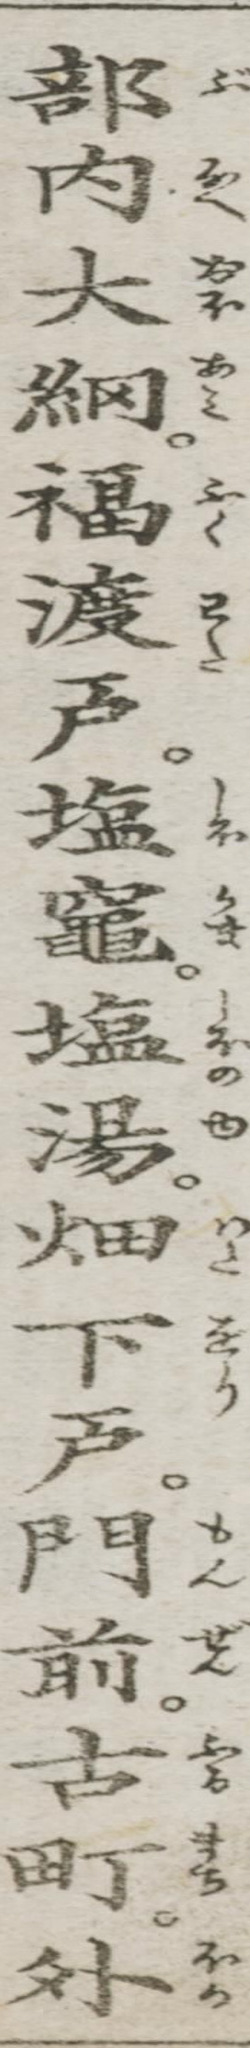部内大網。福渡戸。塩竈。塩湯。畑下戸。門前。古町。外

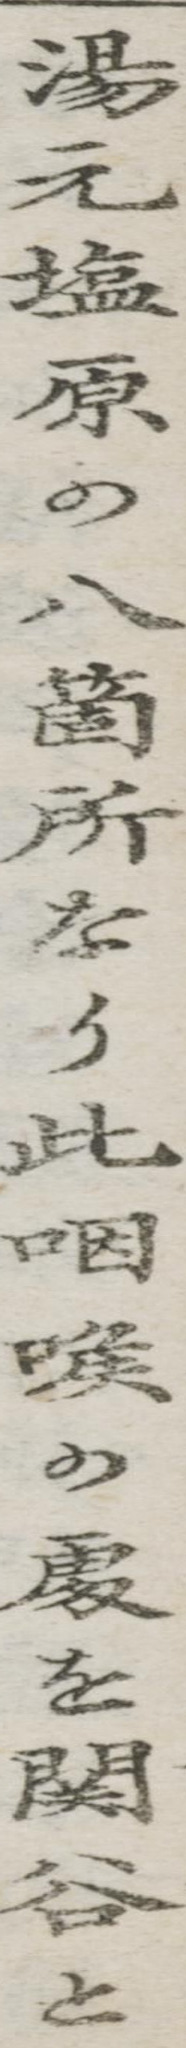湯本塩原の八箇所なり此咽喉の処を関谷と
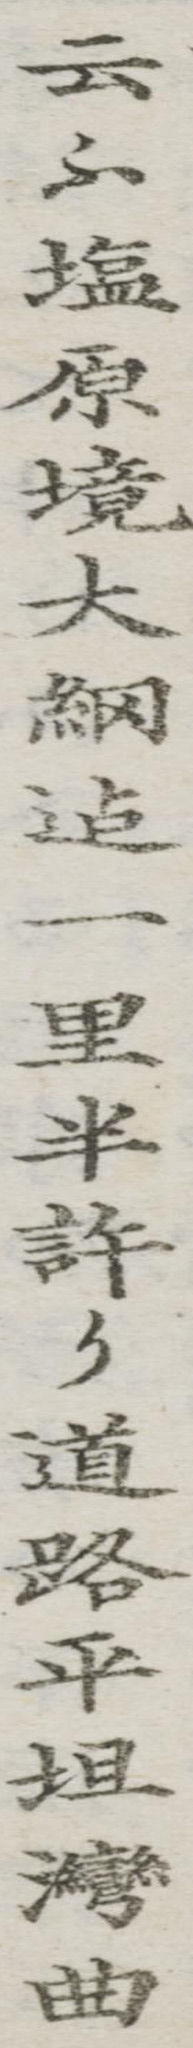云ふ塩原境大網迄一里半許り道路平坦湾曲
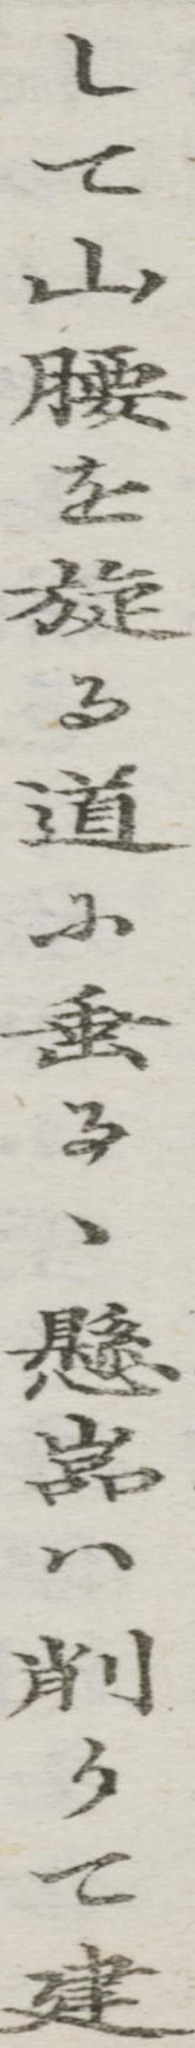して山腰を旋る道に垂るゝ懸岩は削りて建
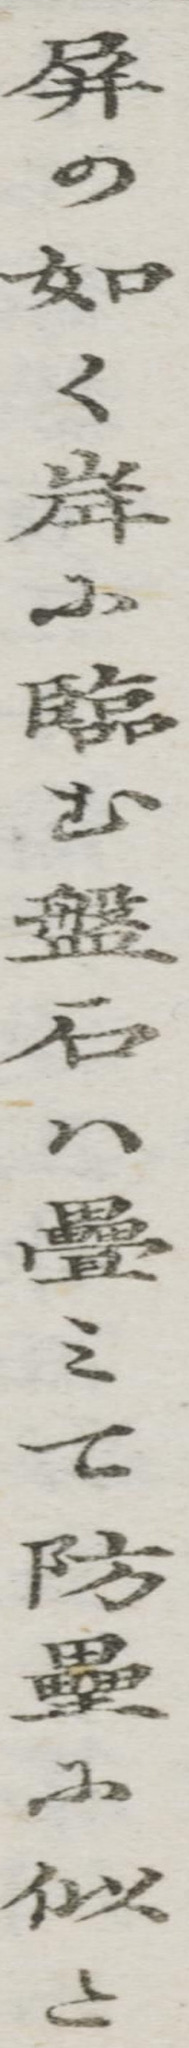屏の如く岸に臨む盤石は畳みて防塁に似た
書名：塩原繁昌記　全
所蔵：東京大学地震研究所図書室 Earthquake Research Institute Library, The University of Tokyo, JAPAN
